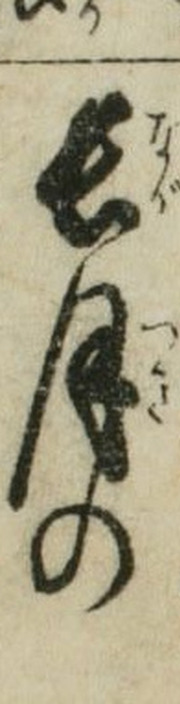長月の
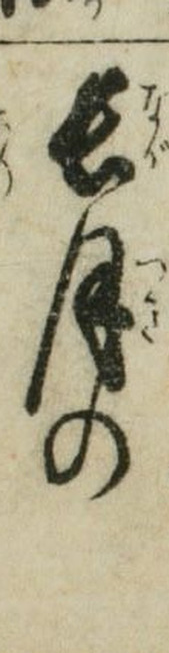長月の
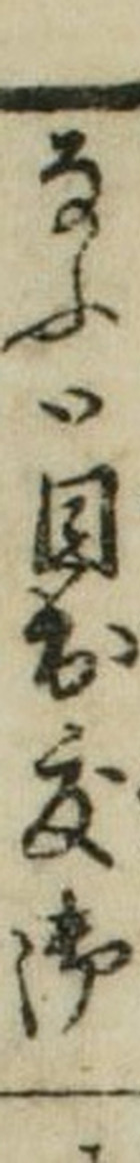なふ御目出度御
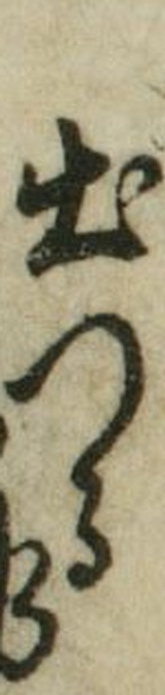出つる

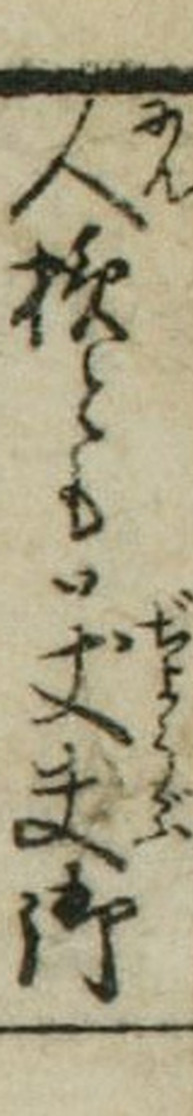人様とも御丈夫御
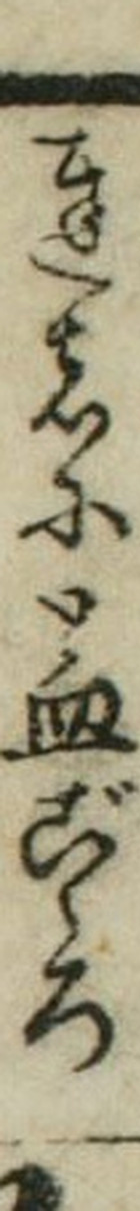達者に御血ごゝろ
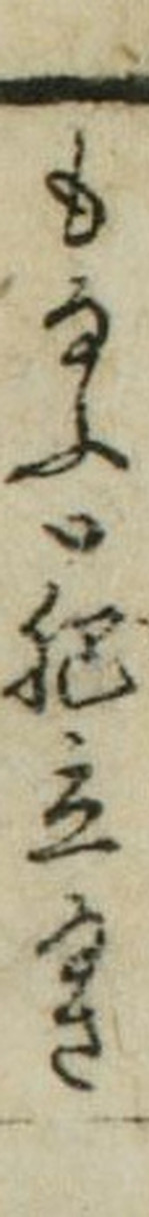もなふ御肥立なさ
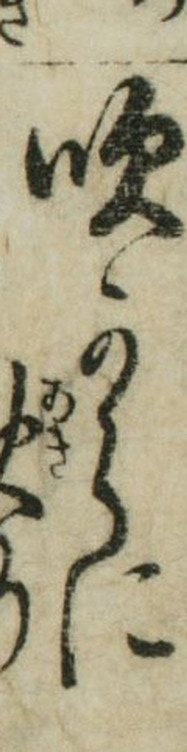吹からに
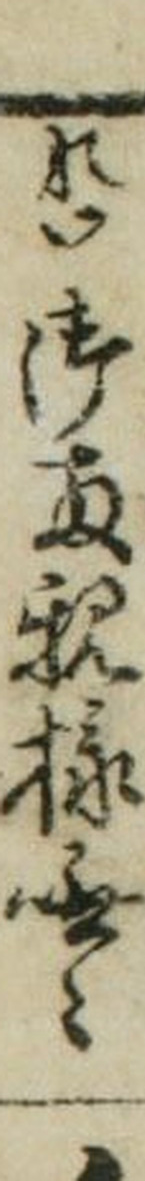れ御両親様嘸々
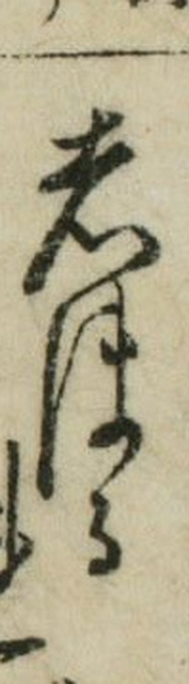しほる
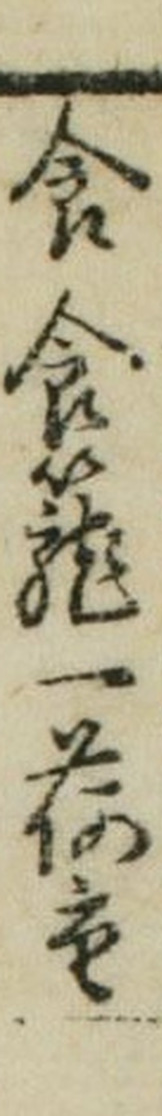食食籠一荷重
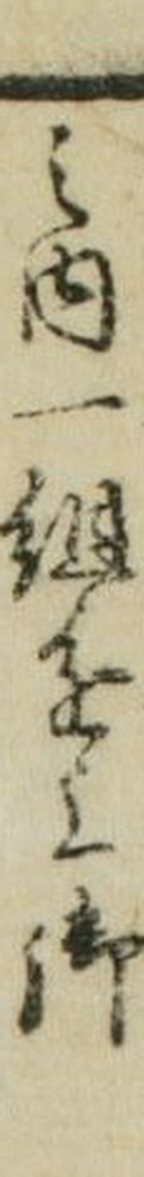之内一組進上御
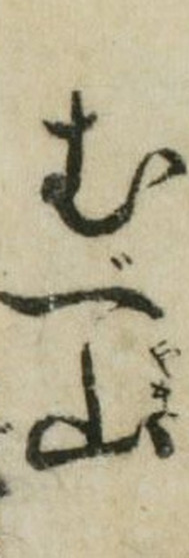むべ山
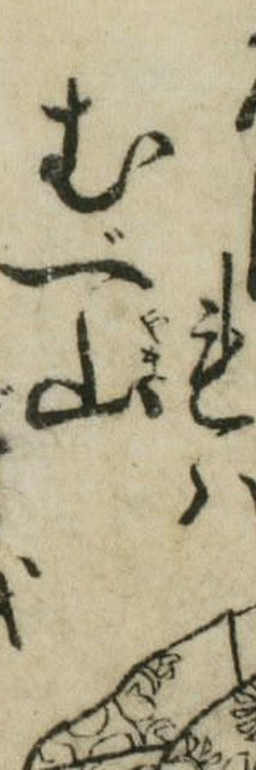むべ山
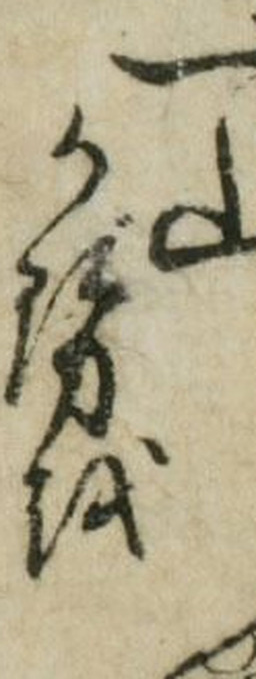かぜを
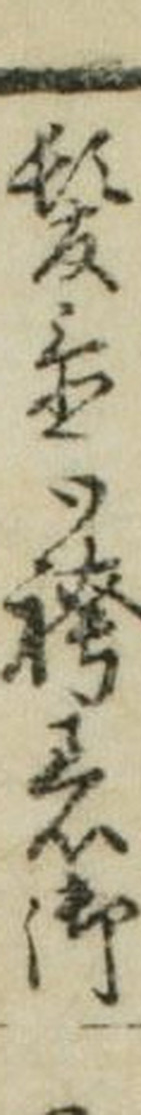髪置御袴着御
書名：百人一首
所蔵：東京学芸大学教育コンテンツアーカイブ
